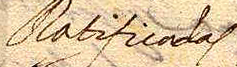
Ratificadas
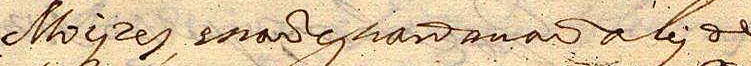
Moyzes, E naō guardauaõ a lej de
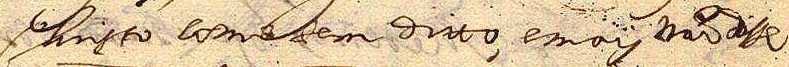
Christo como tem ditto, e mais naõ disse
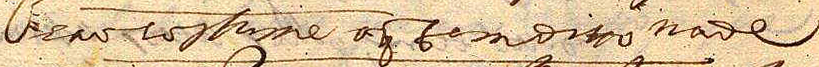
E ao costume o q̄ tem ditto na de
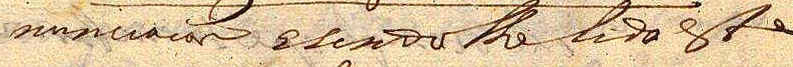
nunciação E sendolhe lido este
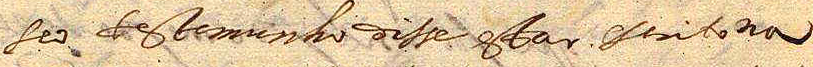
seo testemunho disse estar escrito na
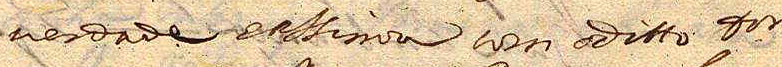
uerdade E assinou com o ditto dor
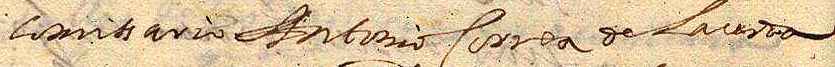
comissario Antonio Correa de Lacerda
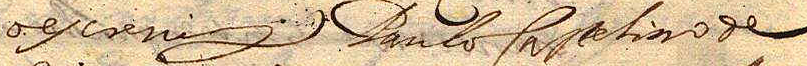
o escreui Paulo Castelino de
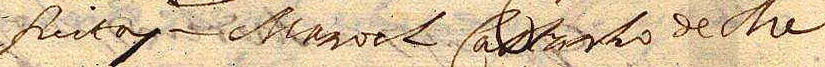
freitas Manoel Castanho de Me
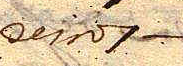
deiros
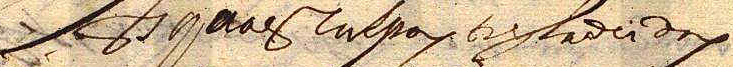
As quaes culpas tresladei das
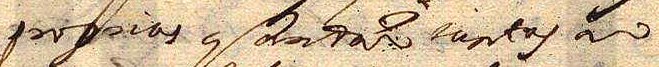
proprias q̄ andaõ iuntas ao
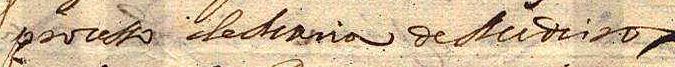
processo de Maria de Medeiros
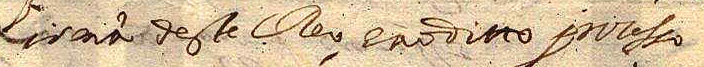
irmã deste Reo, e ao ditto processo
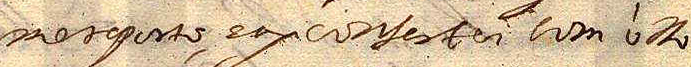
me reporto, E as consertei com o No
